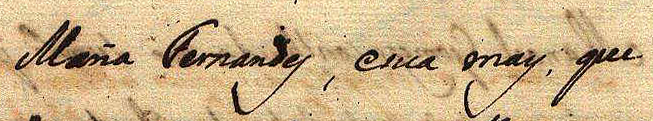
Maria Fernandes, e sua may, que
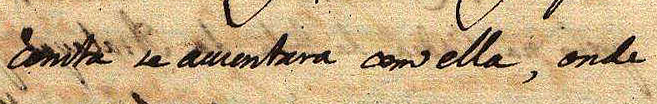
consta se ausentara com ella, onde
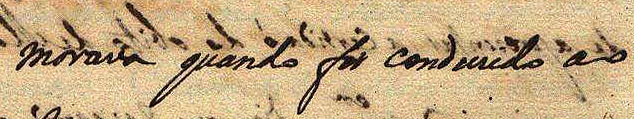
morava quando foi conduzido ao
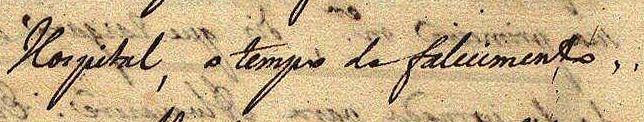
Hospital, o tempo de falecimento,.
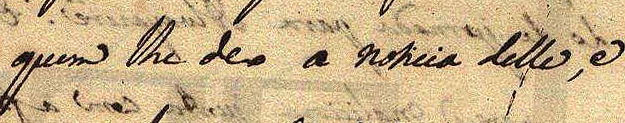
quem lhe deo a noticia delle, e
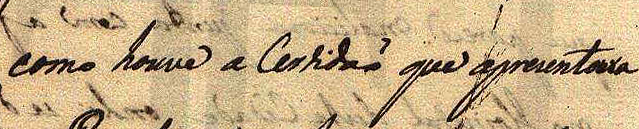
como houve a Certidaõ que apresentara
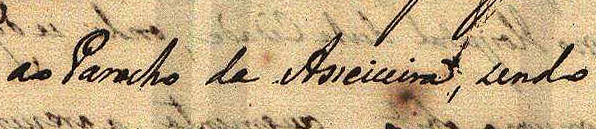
ao Parocho de Asseiceira, sendo
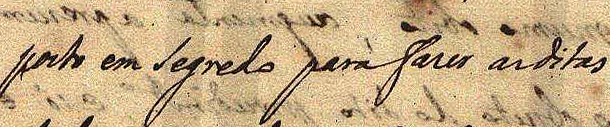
posto em segredo para fazer as ditas
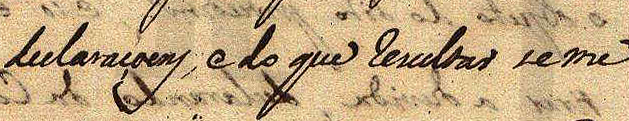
declaraçoens, e do que Resultar se me
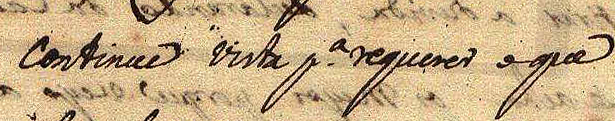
continue vista p.a requerer o que
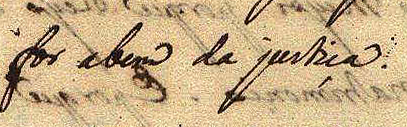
for a bem da justiça.
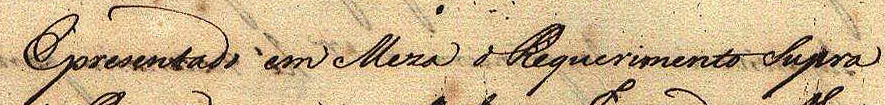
E presentado em Meza o Requerimento Supra
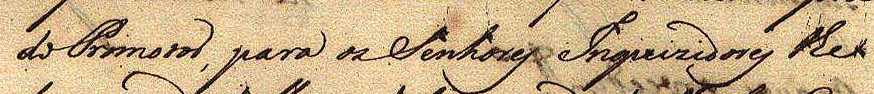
do Promotor, para os Senhores Inquizidores lhe
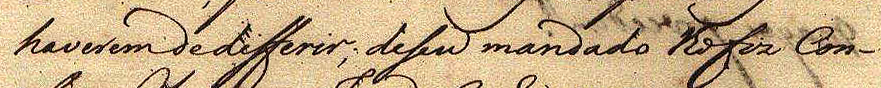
haverem de differir de seu mandado lho fiz Con
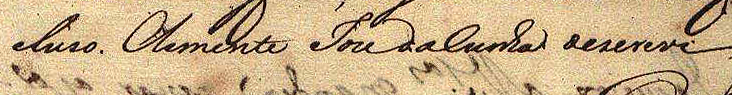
cluzo. Clemente Ioze da Cunha o escrevi
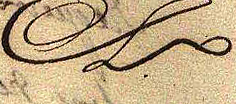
CL.o
